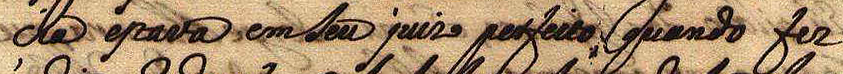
çia estava em seu juizo perfeito, quando fez
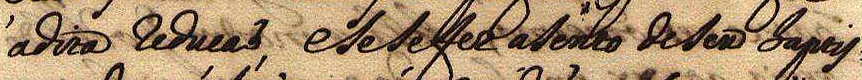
a dita Reduçaõ, e se se fez asento de seu baptis
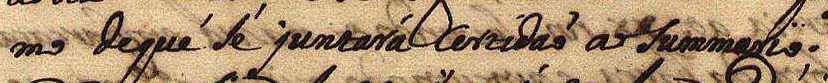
mo de que se juntará certidaõ a summario;
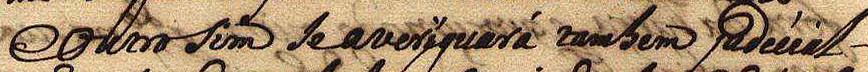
e outrosim se averiguará tambem judicial
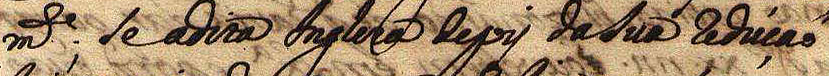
m.te; se a dita Ingleza depois da Sua Reduçaõ
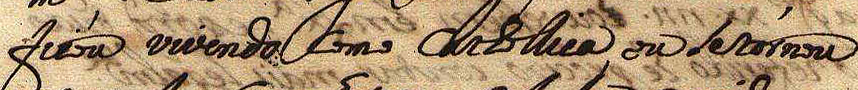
ficou vivendo Como Cathollica, ou se tornou
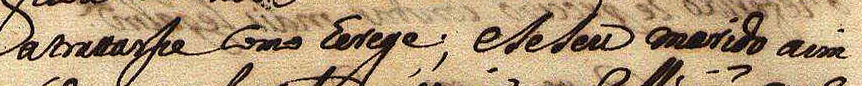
a tratarsse como herege; e se seu marido a im
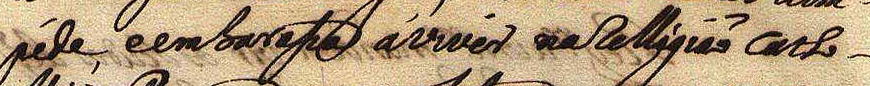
péde, e embarassa a viver na Relligiaõ catho
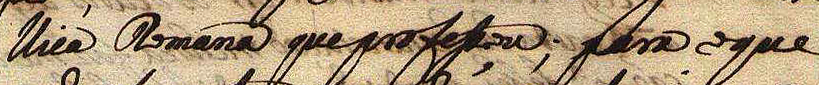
llica Romana que professou; para o que
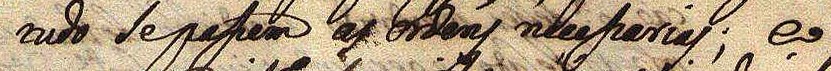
tudo se passem as ordens necessarias; e o
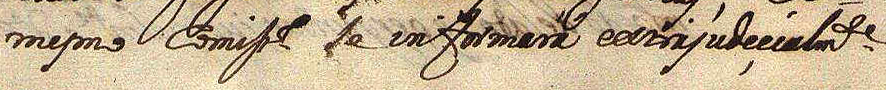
mesmo Comiss.o se informará extrajudeçialm.te
